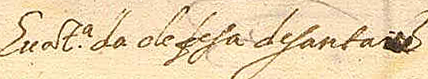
hua t.a da defesa de Santarē
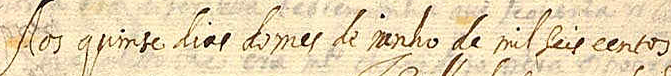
Aos quinse dias do mes de iunho de mil seiscentos
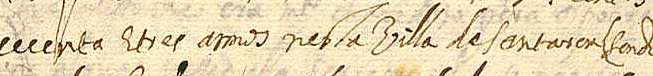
cecenta E tres annos nesta Villa de Santarem (sendo
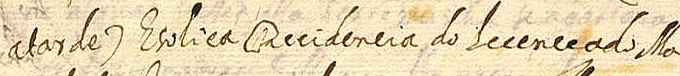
a tarde) Esolica Recidencia do Lecenceado Ma
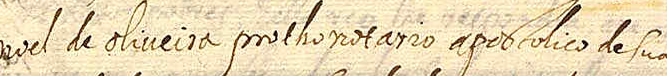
noel de oliueira prothonotario apostolico de sua
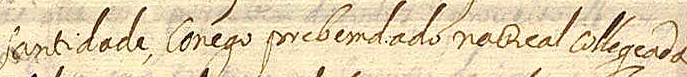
Santidade, Conego prebemdado na Real collegeada
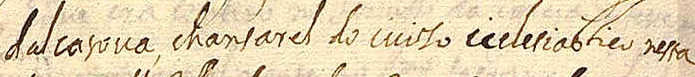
dalcasoua, chansarel do iuizo ecclesiastico nesta
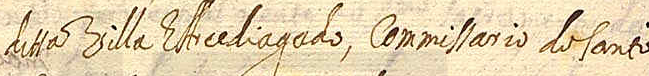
ditta Villa E Arcediagado, Commissario do Santo
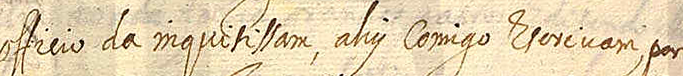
officio da inquisissam, ahy Comigo Escriuam, por
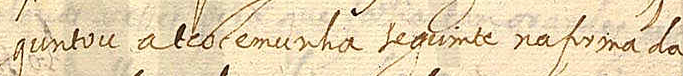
guntou a testemunha seguinte na forma da
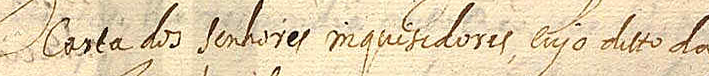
Carta dos Senhores inquisidores, cujo ditto da
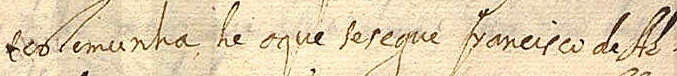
testemunha he o que se segue francisco de Al
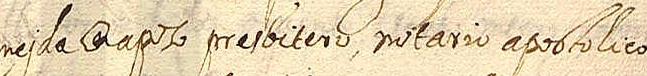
mejda Rapozo presbitero, notario apostolico
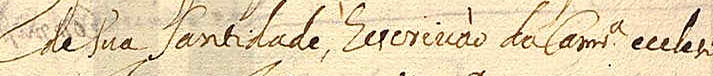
de Sua Santidade, Escriuaõ da Camra. ecclesi
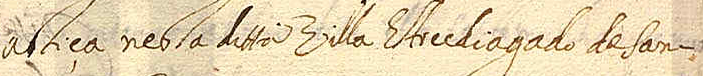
astica nesta ditta Villa E Arcediagado de San
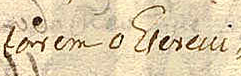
tarem o Escreui
